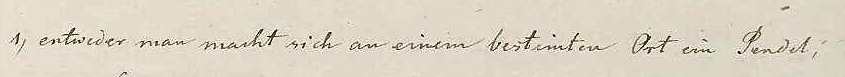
1, entweder man macht sich an einem bestimten Ort ein Pendel,
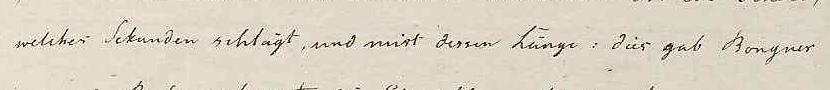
welches Sekunden schlägt, und mist dessen Länge: dies gab Bouguer
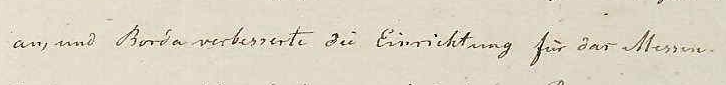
an, und Borda verbesserte die Einrichtung für das Messen.
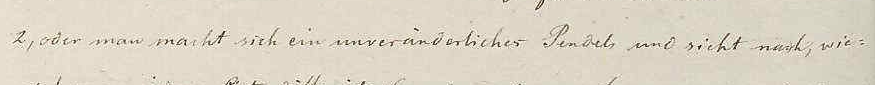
2, oder man macht sich ein unveränderliches Pendel, und sieht nach, wie-
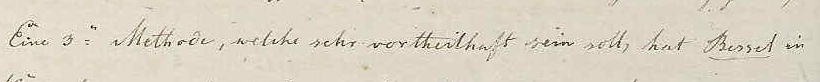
Eine 3￼ Methode, welche sehr vortheilhaft sein soll, hat Bessel in
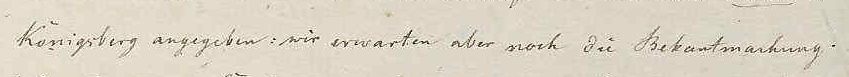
Königsberg angegeben: wir erwarten aber noch die Bekantmachung.
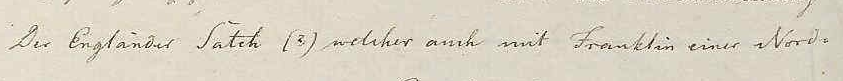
Der Engländer Satch welcher auch mit Franklin einer Nord-
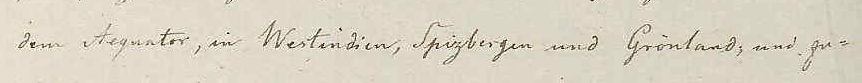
dem Aequator, in Westindien, Spizbergen und Grönland, und zu-
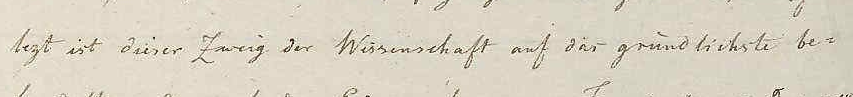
lezt ist dieser Zweig der Wissenschaft auf das gründlichste be-
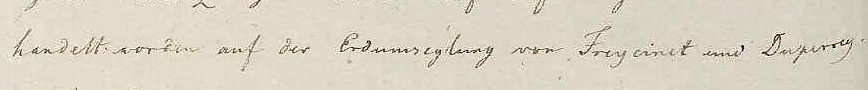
handelt worden auf der Erdumseglung von Freycinet und Duperrey.
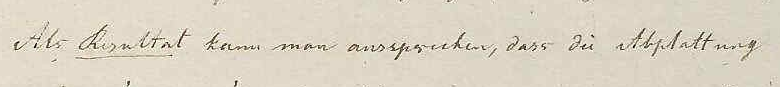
Als Resultat kann man aussprechen, dass die Abplattung
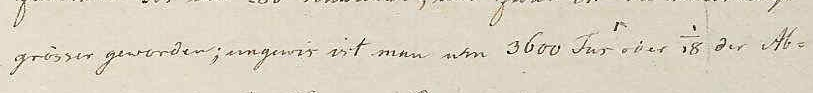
grösser geworden; ungewis ist man um 3600 Fus oder 1
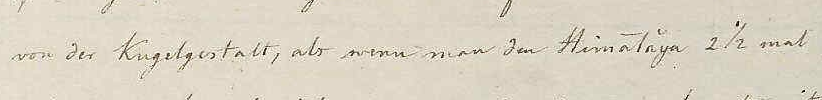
von der Kugelgestalt, als wenn man den Himalaya 2½ mal
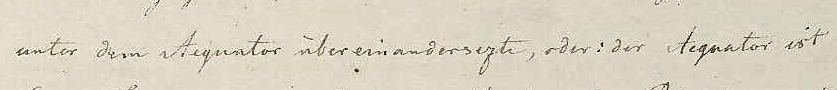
unter dem Aequator übereinandersezte, oder: der Aequator ist
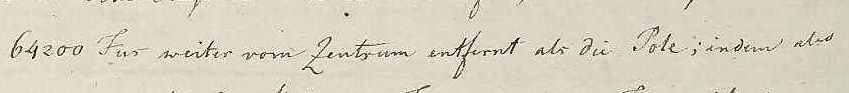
64200 Fus weiter vom Zentrum entfernt als die Pole; indem also
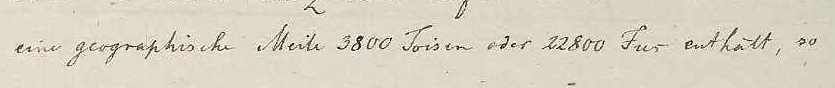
eine geographische Meile 3800 Toisen oder 22800 Fus enthält, so
